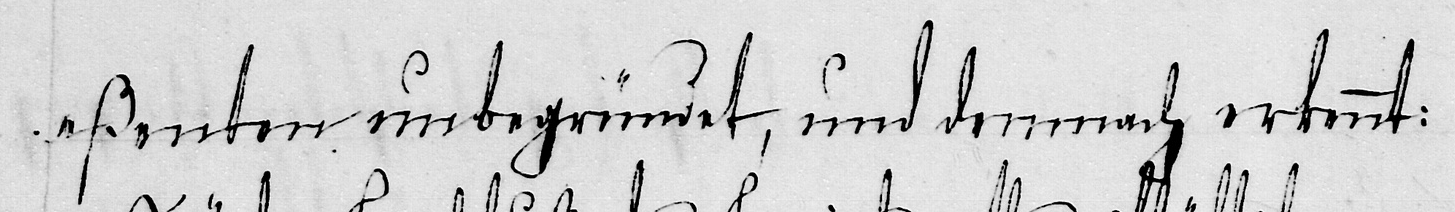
eßenten unbegründet, und demnach erkennt:
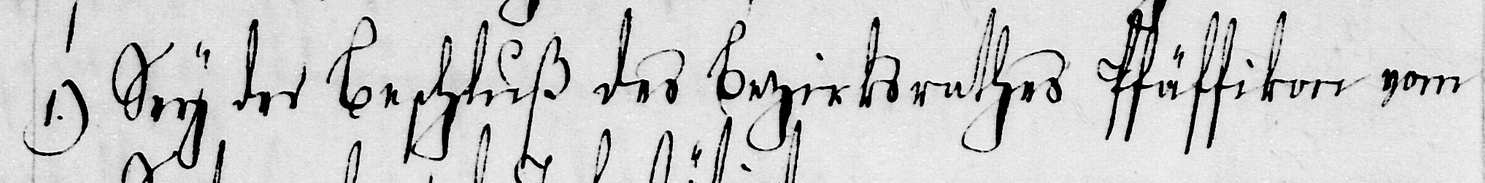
1.) Sey der Beschluß des Bezirksrathes Pfäffikon vom
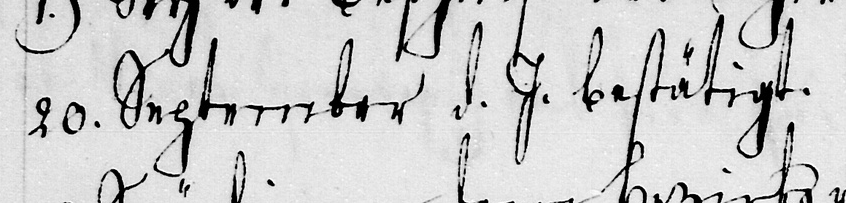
20. September d. J. bestätigt.
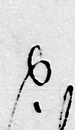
t.
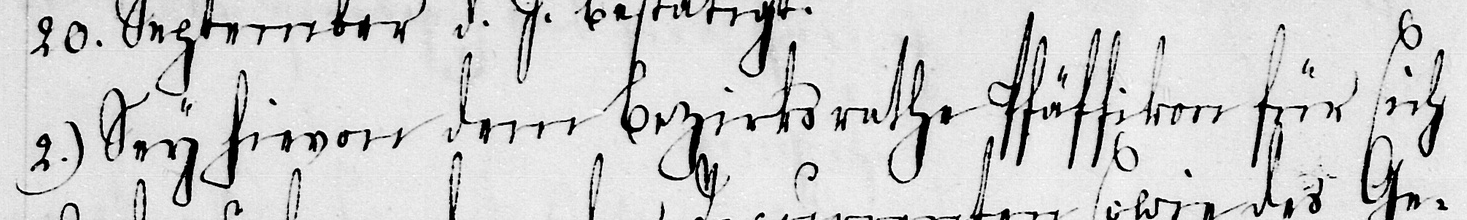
2.) Sey hievon dem Bezirksrathe Pfäffikon für sich
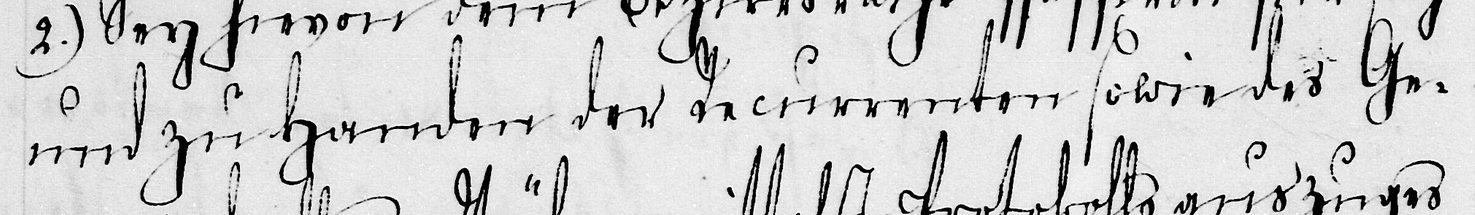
und zu Handen der Recurrenten sowie des Ge¬
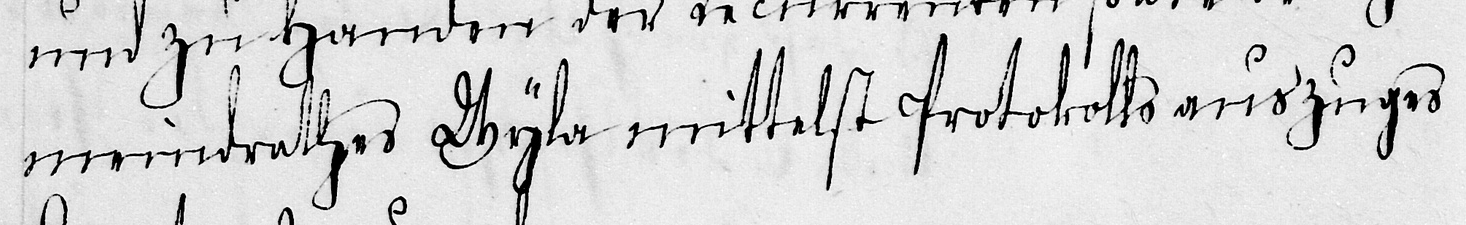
meindrathes Wyla mittelst Protokollsauszuges
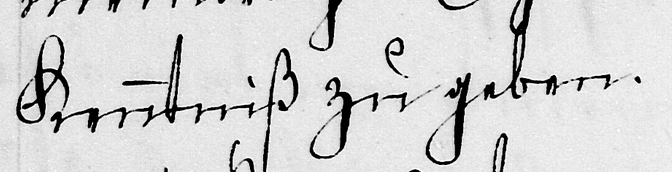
Kenntniß zu geben.
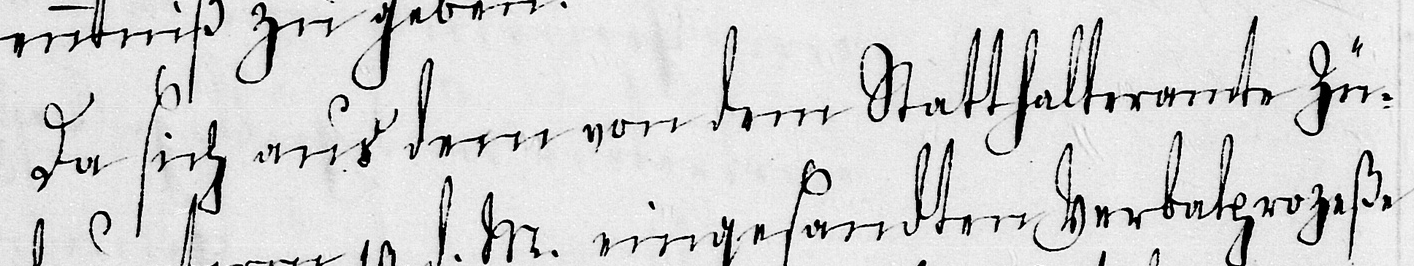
Da sich aus dem von dem Statthalteramte Zü¬
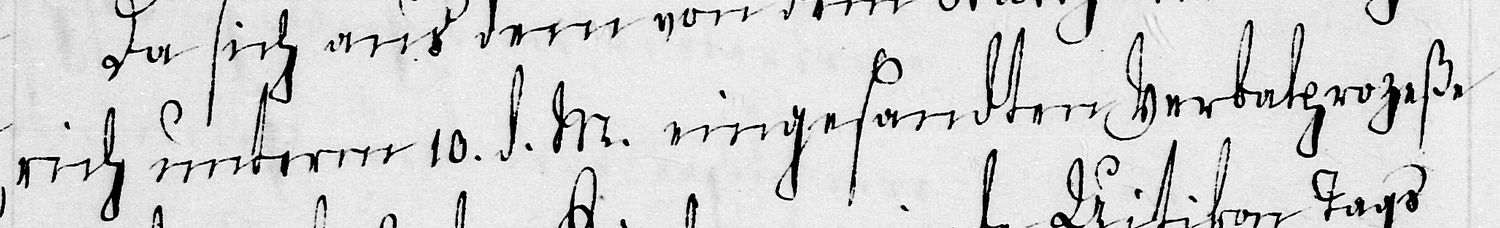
rich unterm 10. d. M. eingesandten Verbalprozeße
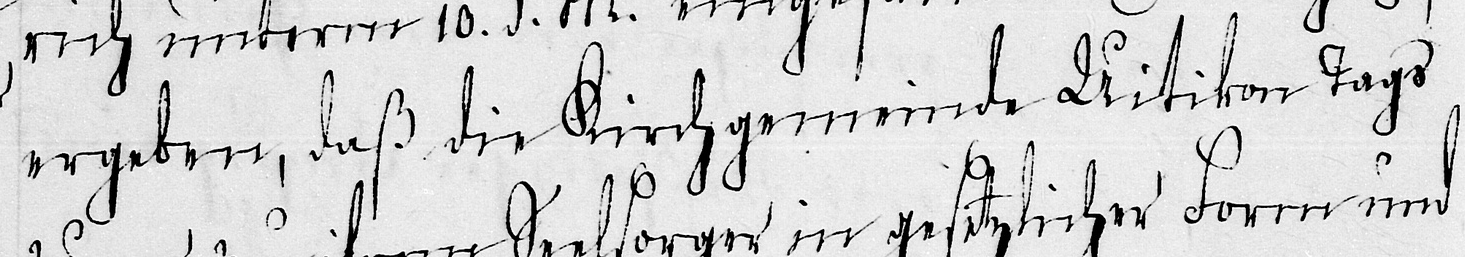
ergeben, daß die Kirchgemeinde Uitikon Tags
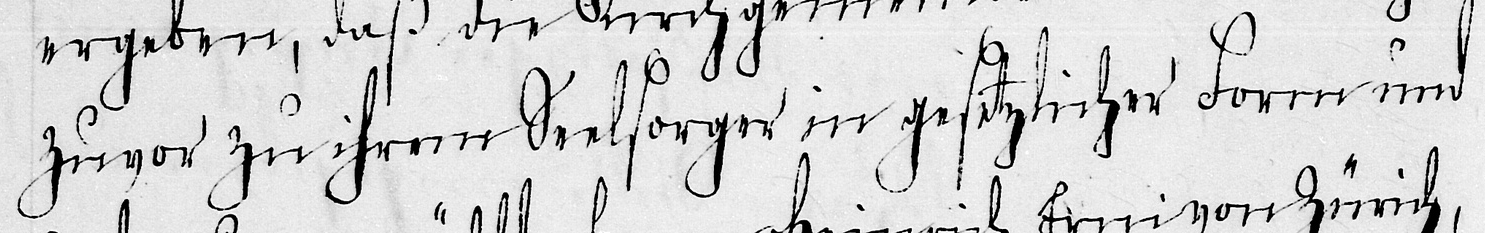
zuvor zu ihrem Seelsorger in gesetzlicher Form und
